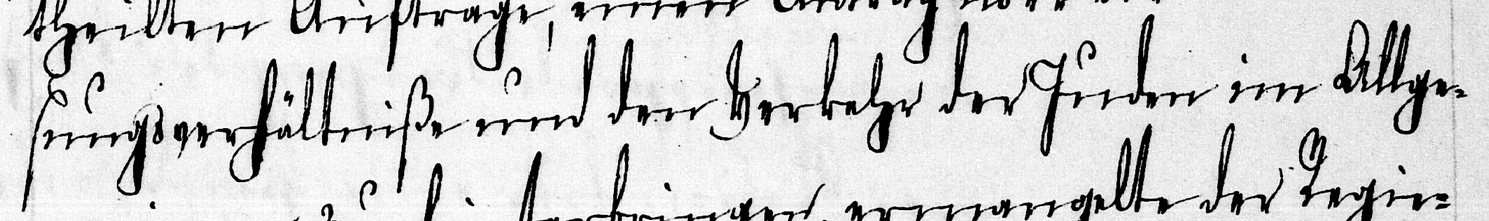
ungsverhältniße und den Verkehr der Juden im Allge¬
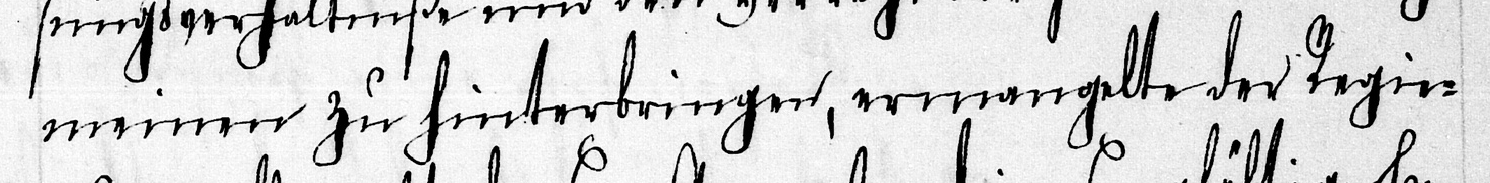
meinen zu hinterbringen, ermangelte der Regie¬
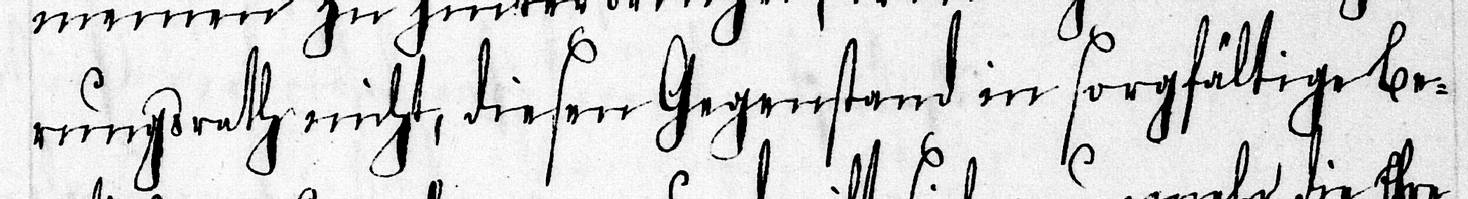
rungsrath nicht, diesen Gegenstand in sorgfältige Be¬
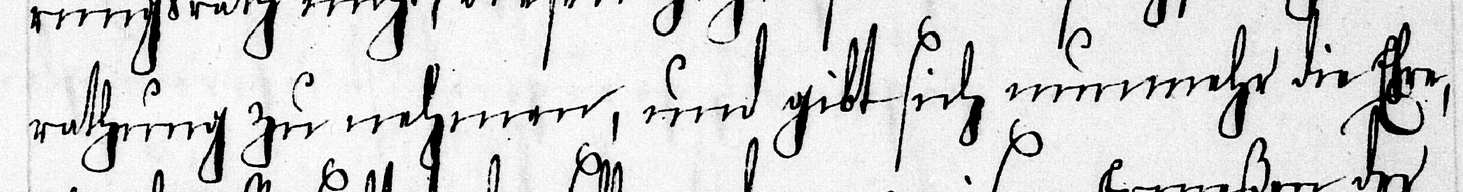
rathung zu nehmen, und gibt sich nunmehr die Ehre,
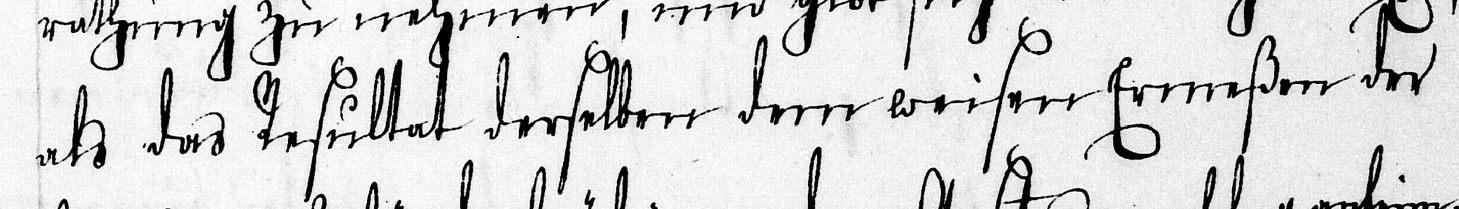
als das Resultat derselben dem weisen Ermeßen der
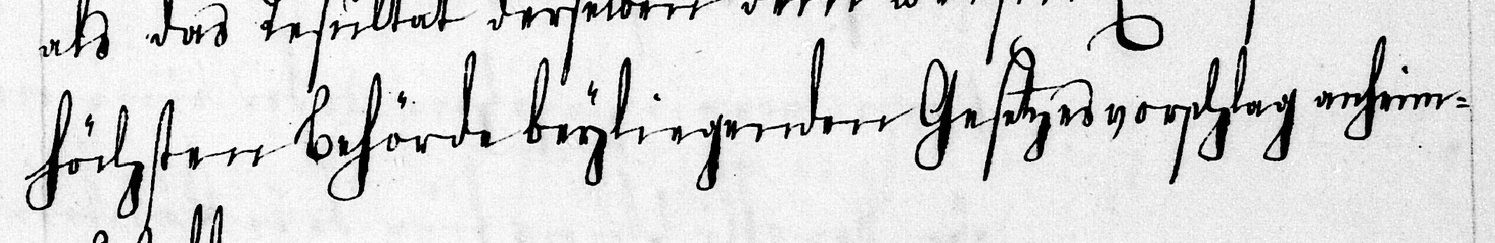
höchsten Behörde beyliegenden Gesetzesvorschlag anhei¬
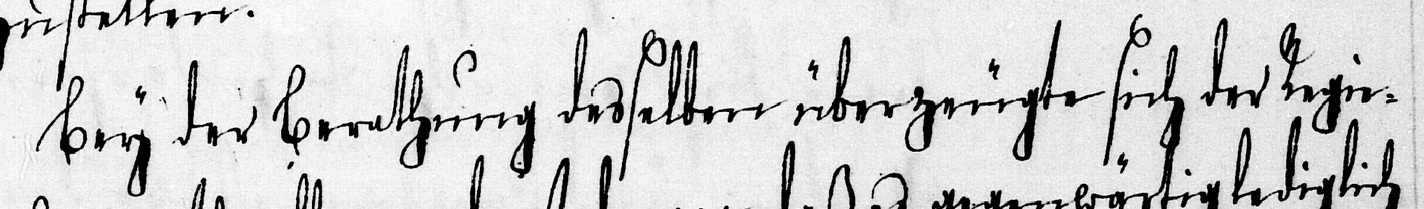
Bey der Berathung desselben überzeugte sich der Reg¬
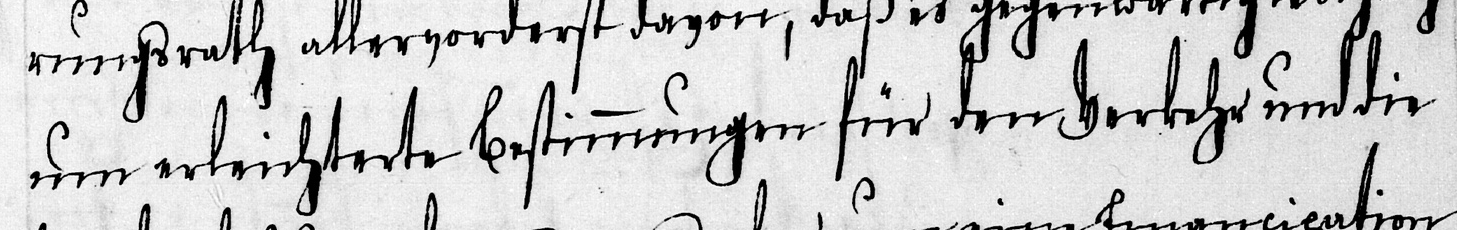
um erleichterte Bestimmungen für den Verkehr und die
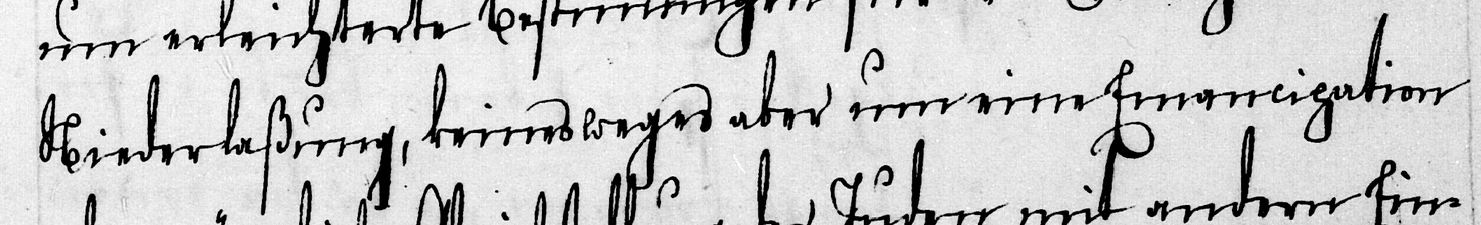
Niederlaßung, keinesweges aber um eine Emancipation
